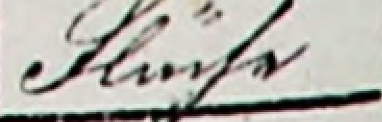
Fläche
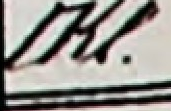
Ckl.
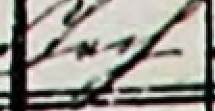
Tech
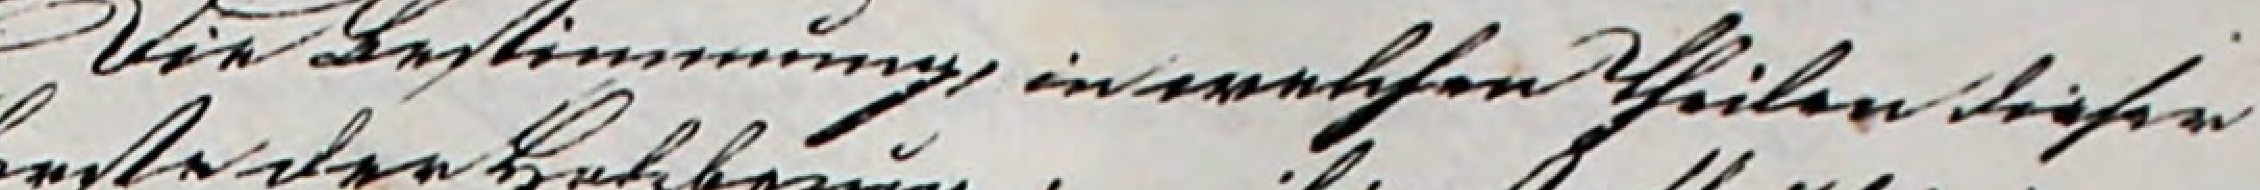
Die Bestimmung, in welchen Theilen dieser
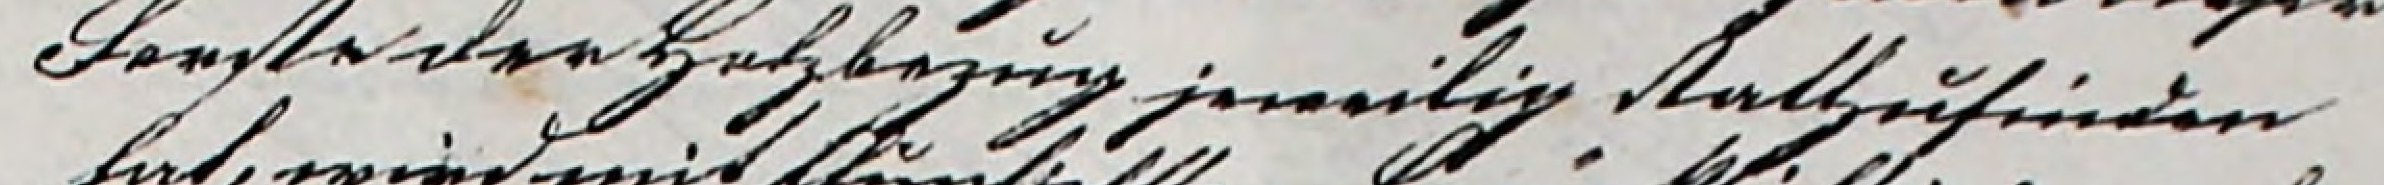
Forste der Holzbezug jeweilig Stattzufinden
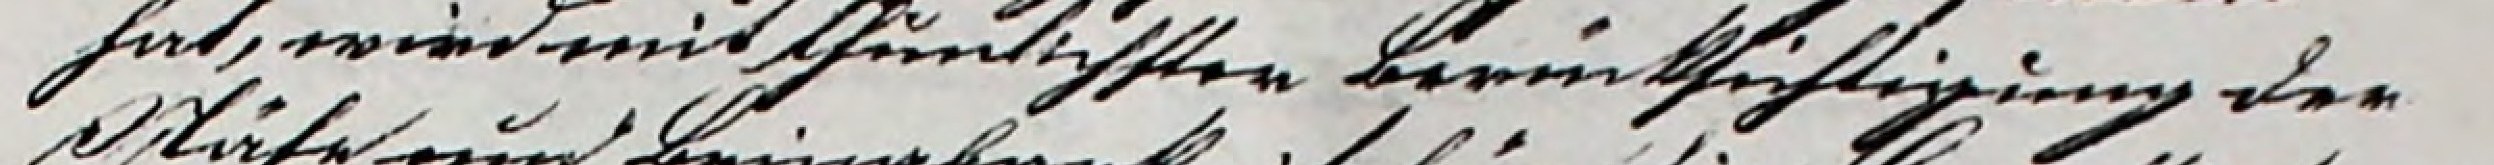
hat, wird mit Thunlichster Berücksichtigung der
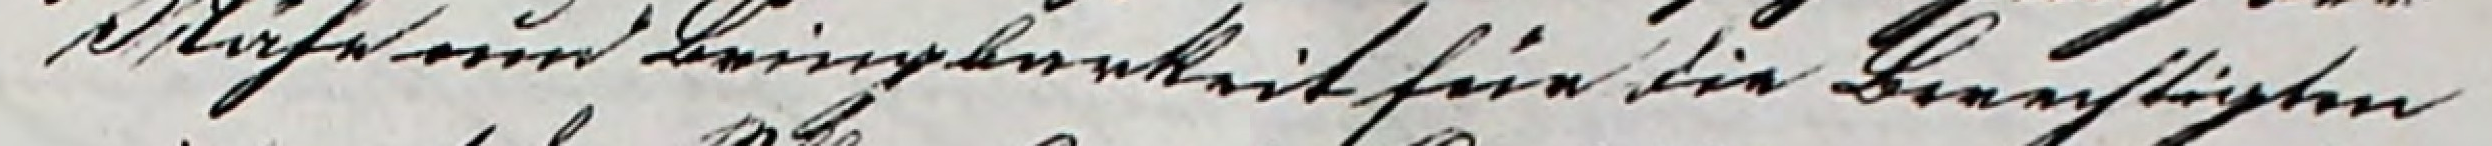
Mähe und Bringbarkeit für die Berechtigten
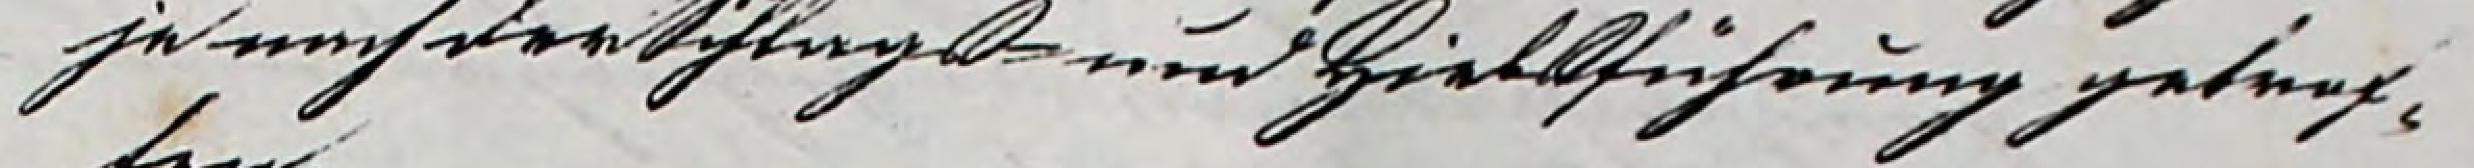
je nach der Schlags- und Hiebsführung getrof„
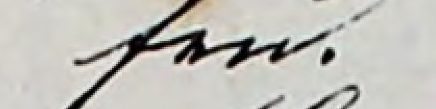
fen.
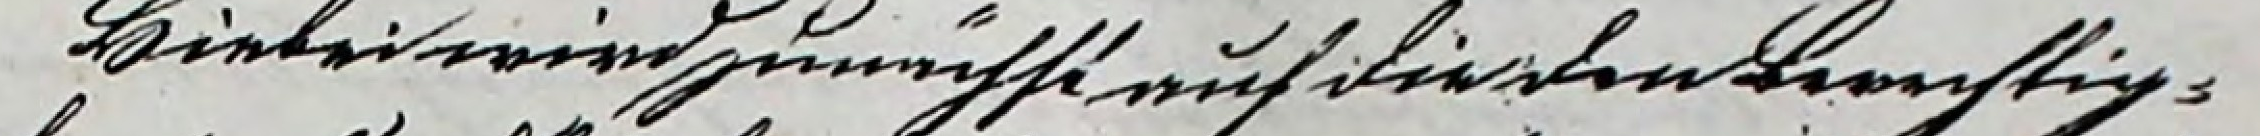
Wiebei wird zunächst auf die den Berechtig„
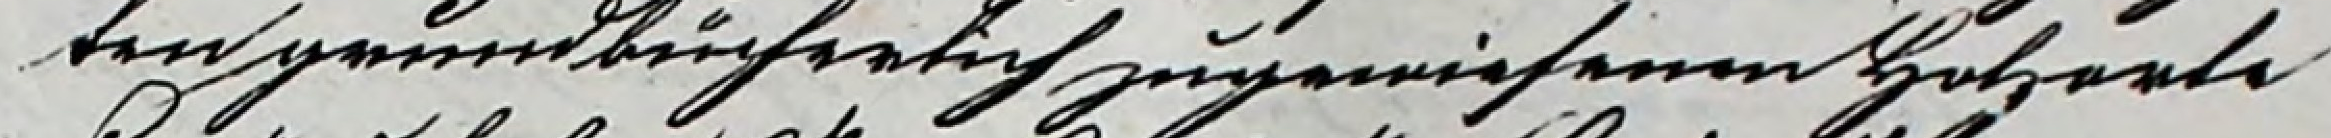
ten grundbüchertich zugewiesenen Holzorte
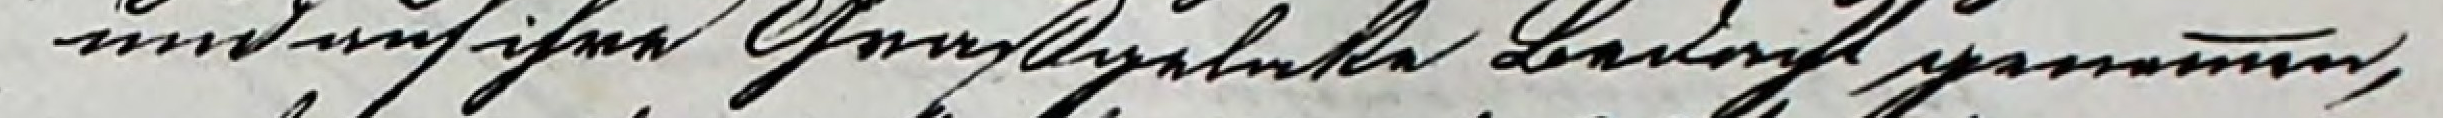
und auf ihre Graßgelake Bedacht genommen,
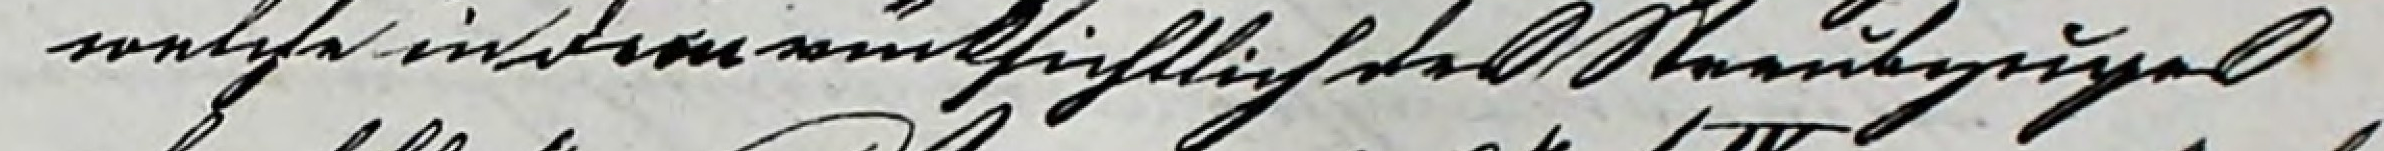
welche in dem rücksichtlich des Streubezuges
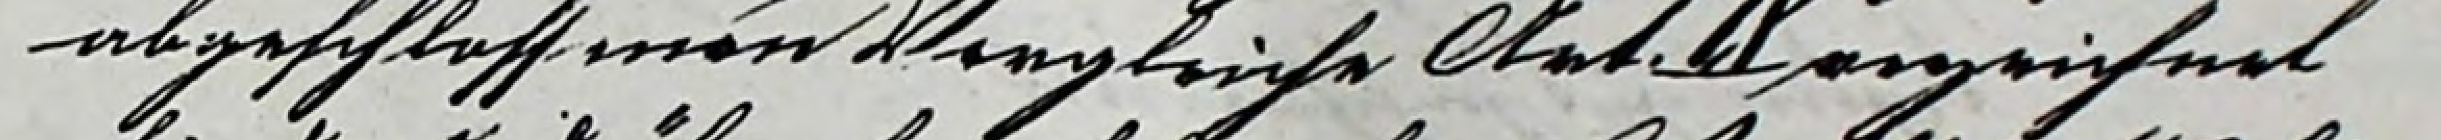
abgeschlossen Vergleiche Art. IX verzeichnet
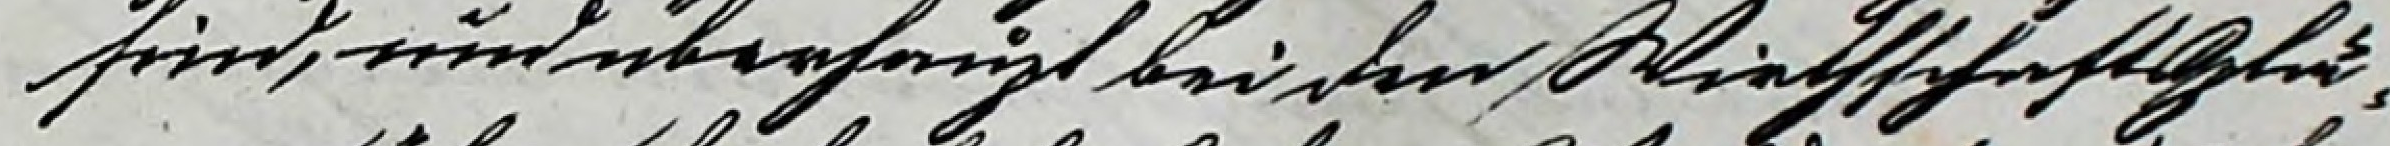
feind, und überhaupt bei den Wirthschaftsplä„
